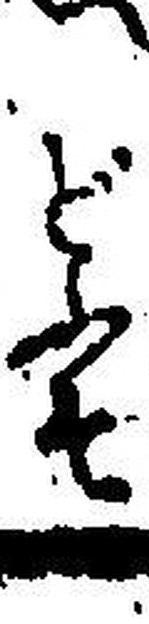どふそ
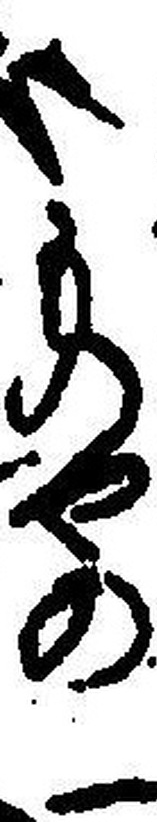ものやの
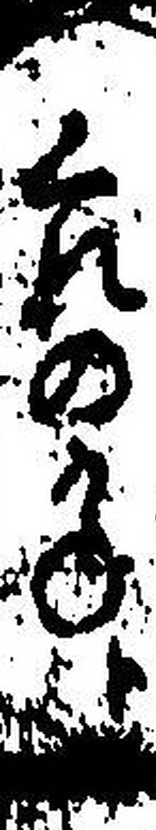くれのかね
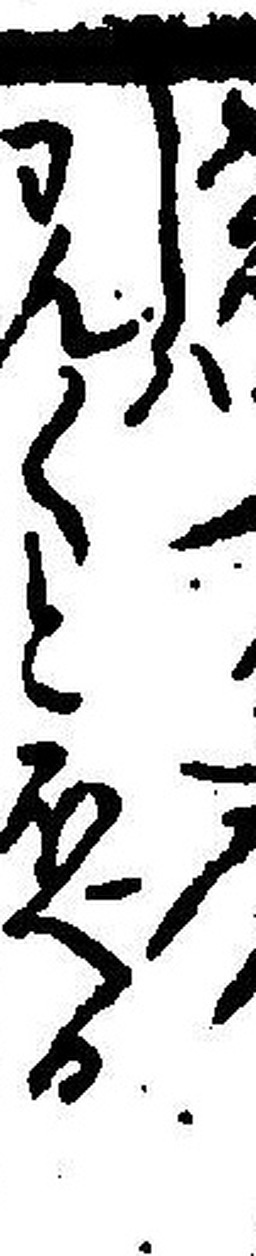わん〳〵とほへる
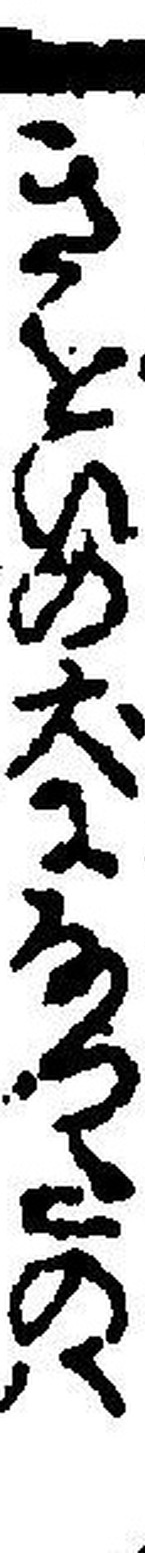きをいの犬になつたのは
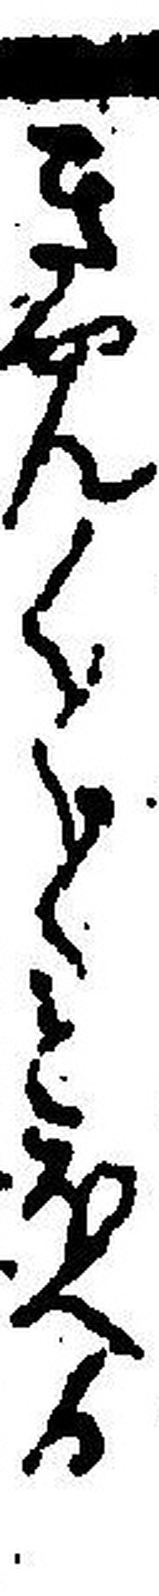きや〳〵〳〵〳〵とほへる
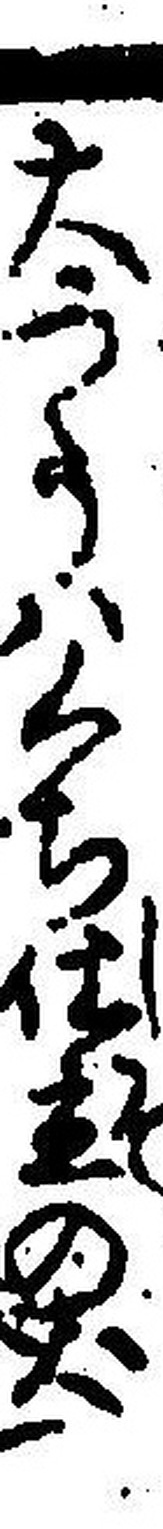大つうはくち仕立の犬
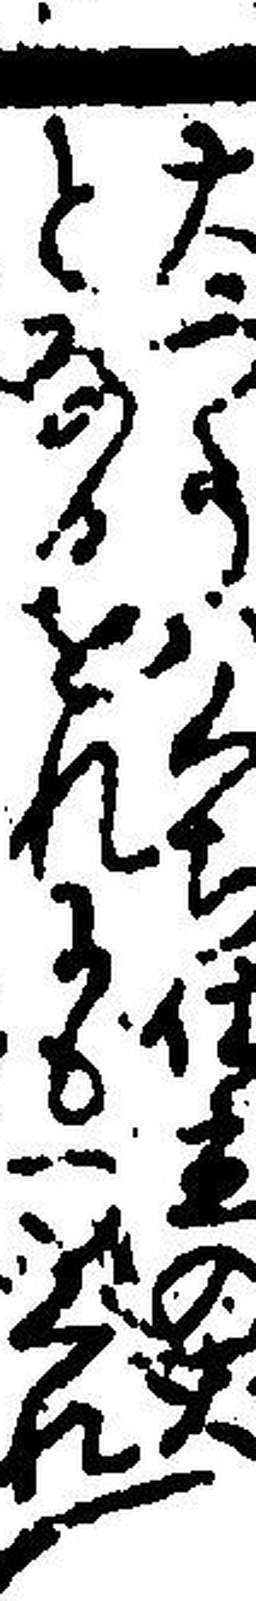となるをれにも一つくれ
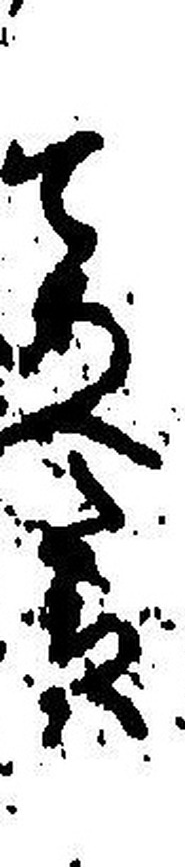てめへたちは
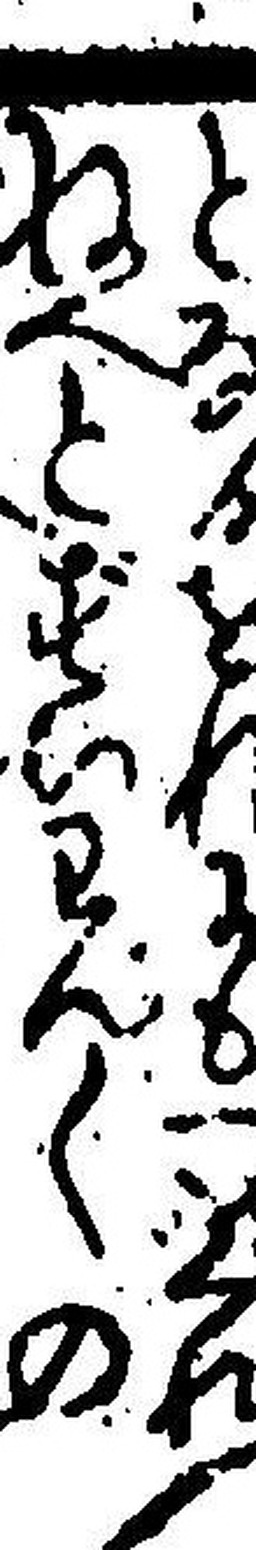ねへとずいわん〳〵の
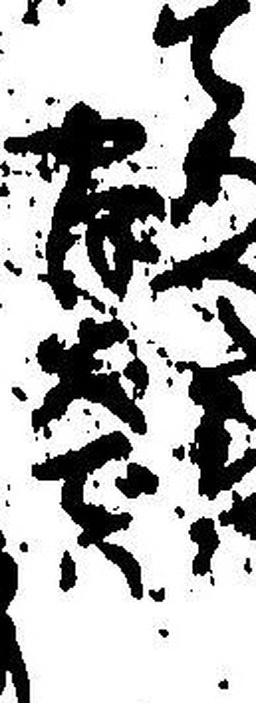やぼ犬では
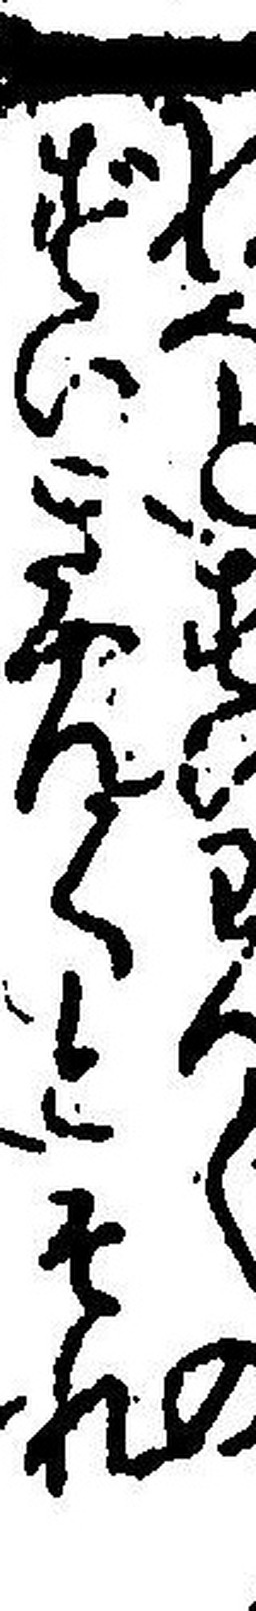ずいきやん〳〵それ
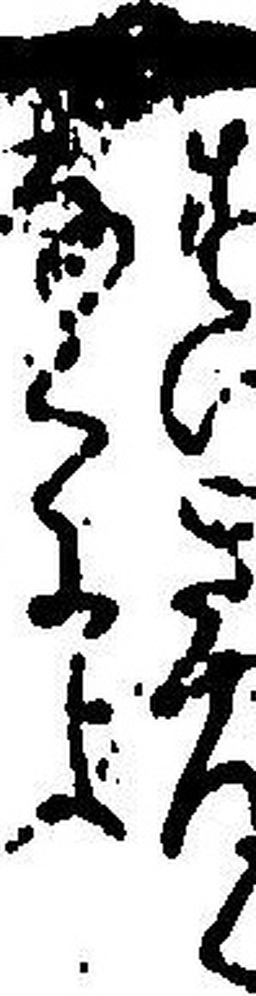なくによ
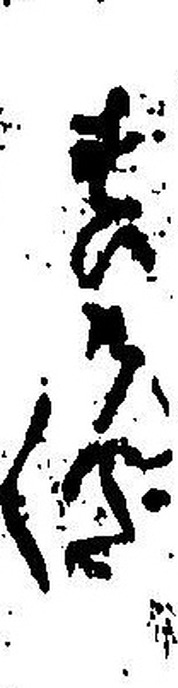すいけんだ
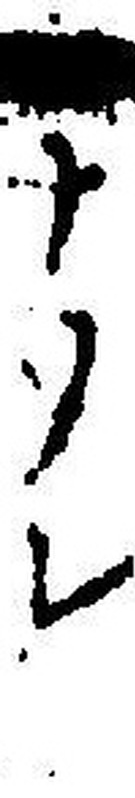ナソレ
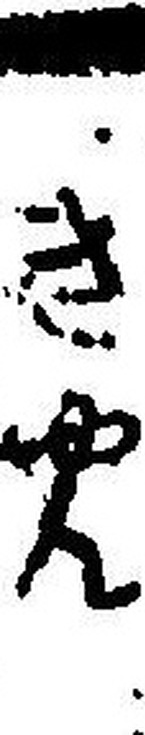きやん
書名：花芳野犬斑 / 山東京伝作
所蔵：東京大学総合図書館 General Library in the University of Tokyo, JAPAN
